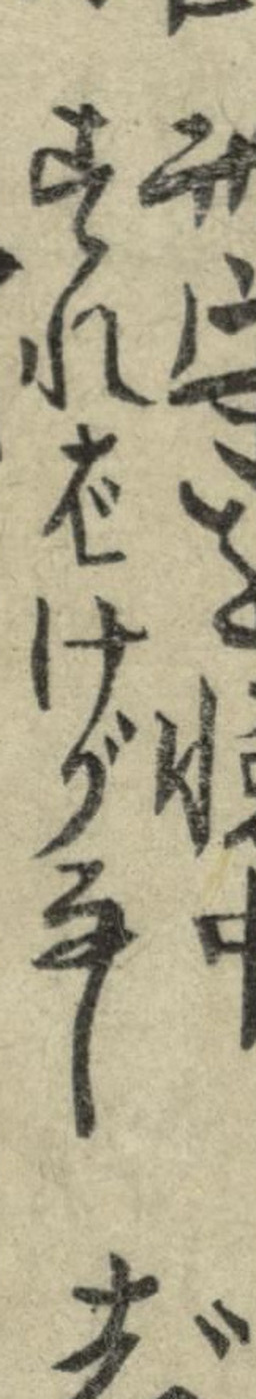抬すればけがなし
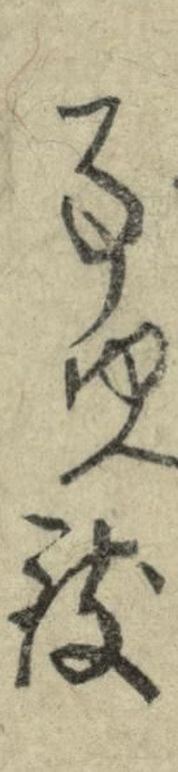事ゆへ致
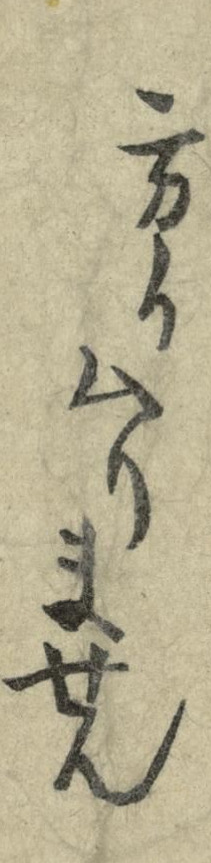方か厶りません
